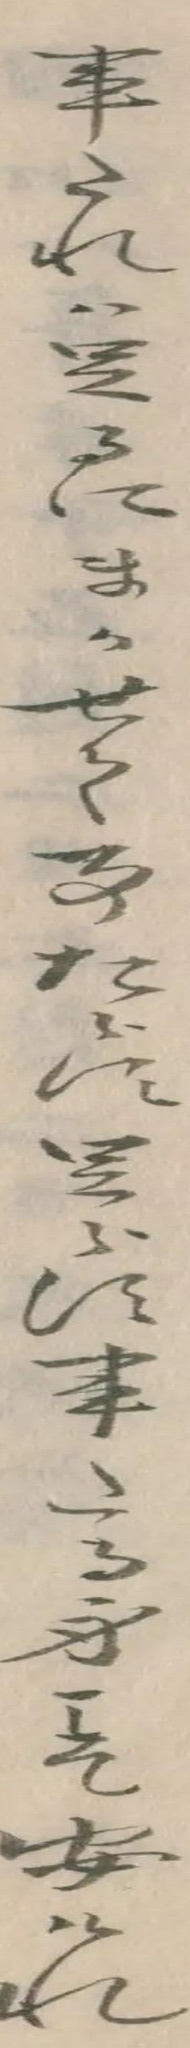事たれは足るにまかせて事たらす足らす事たる身こそ安けれ
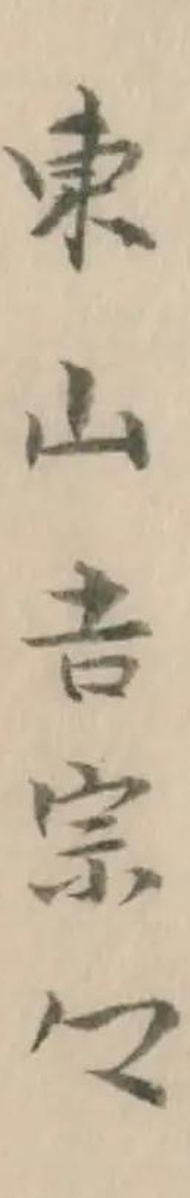東山吉宗卿

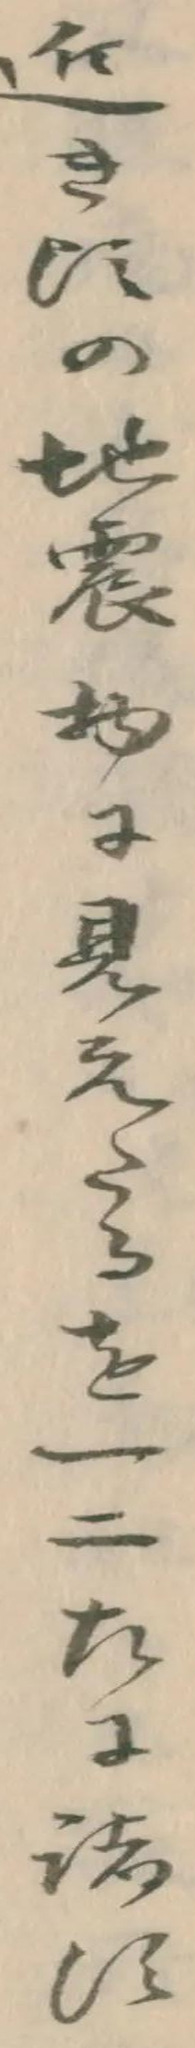近き頃の地震物に見えたるを一二左に諸す
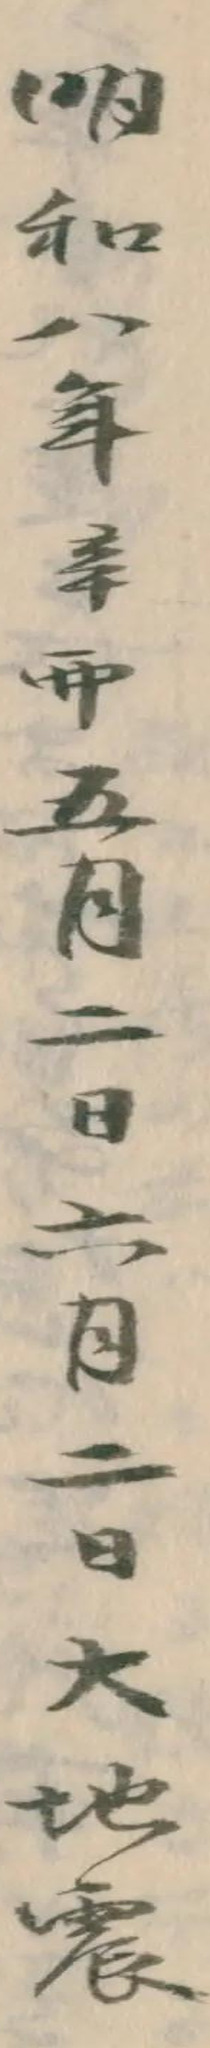明和八年辛卯五月二日六月二日大地震
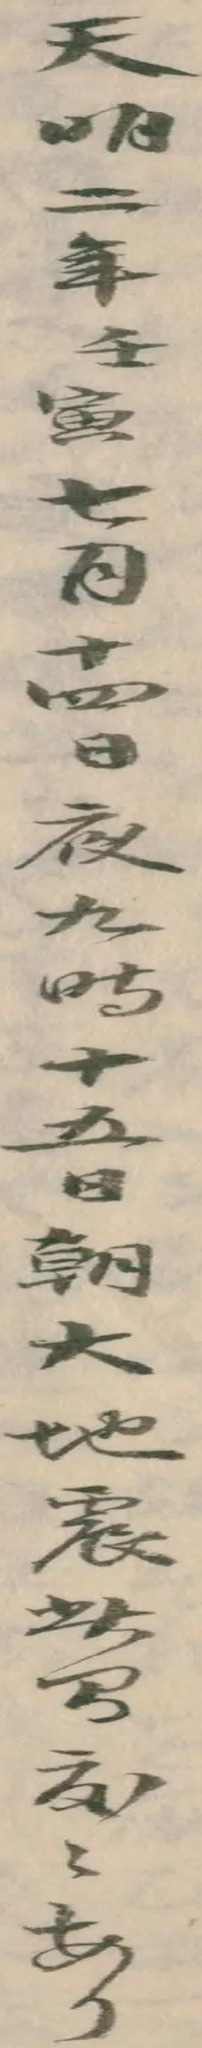天明二年壬寅七月十四日夜九時十五日朝大地震此間度々あり
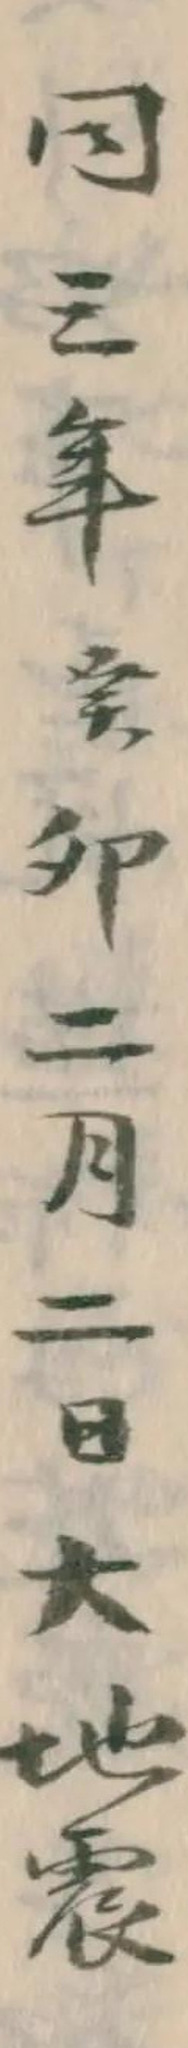同三年癸卯二月二日大地震
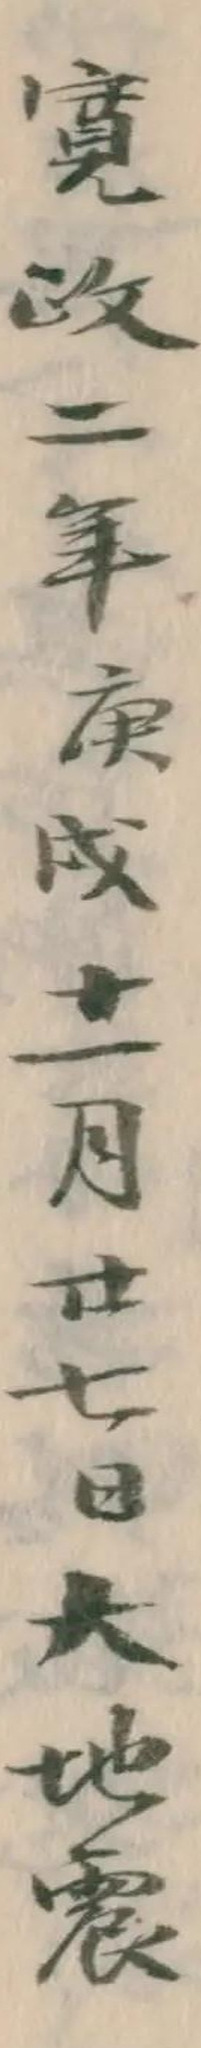寛政二年庚戌十一月廿七日大地震
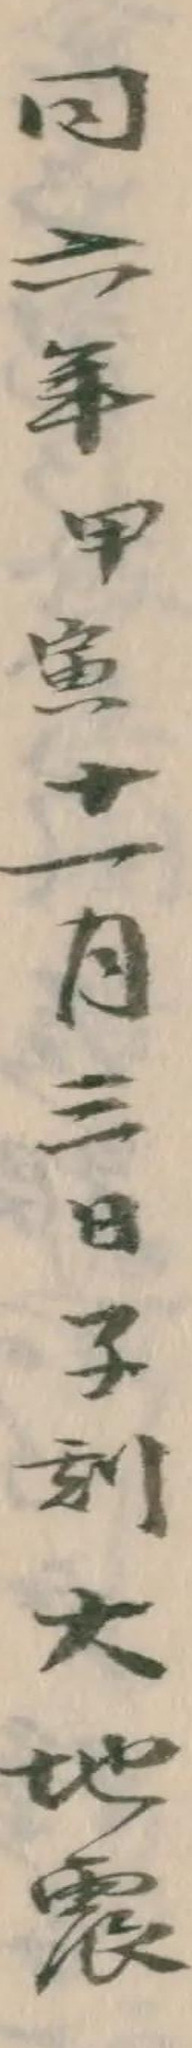同六年甲寅十一月三日子刻大地震
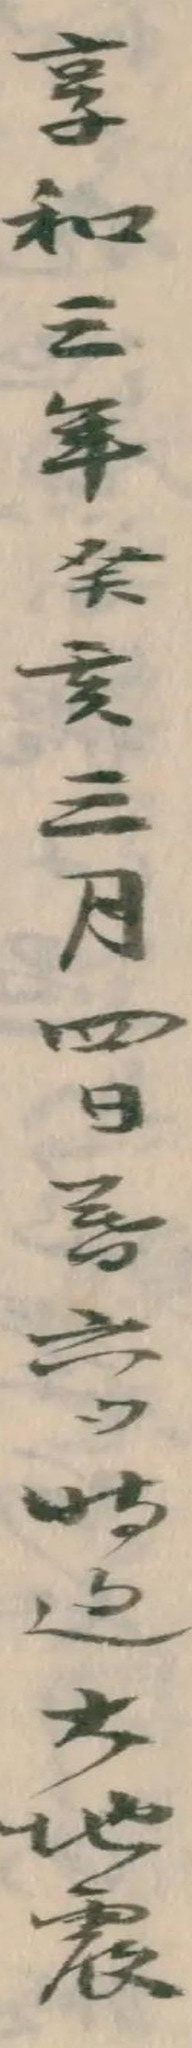享和三年癸亥三月四日暮六ツ時過大地震
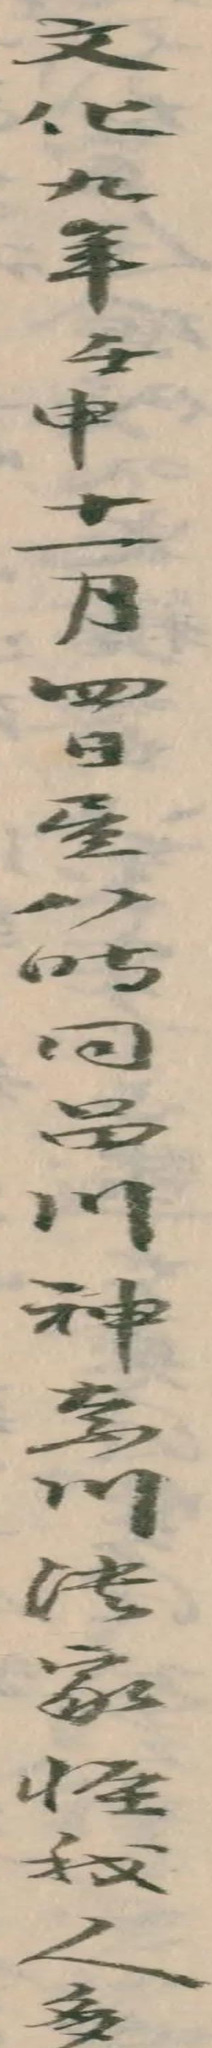文化九年壬申十一月四日昼八時同品川神奈川潰家怪我人多
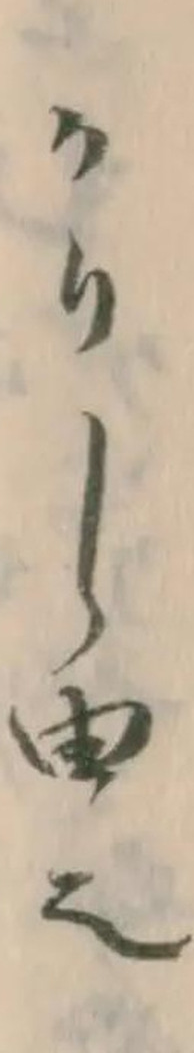かりし由也
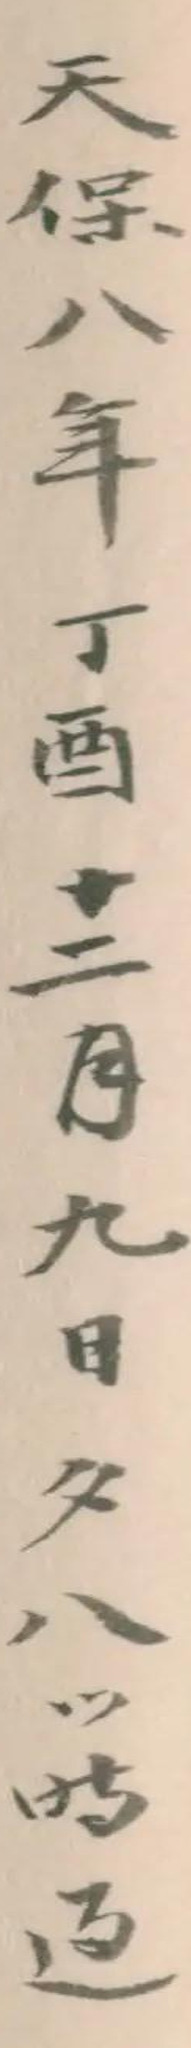天保八年丁酉十二月九日夕八ツ時過
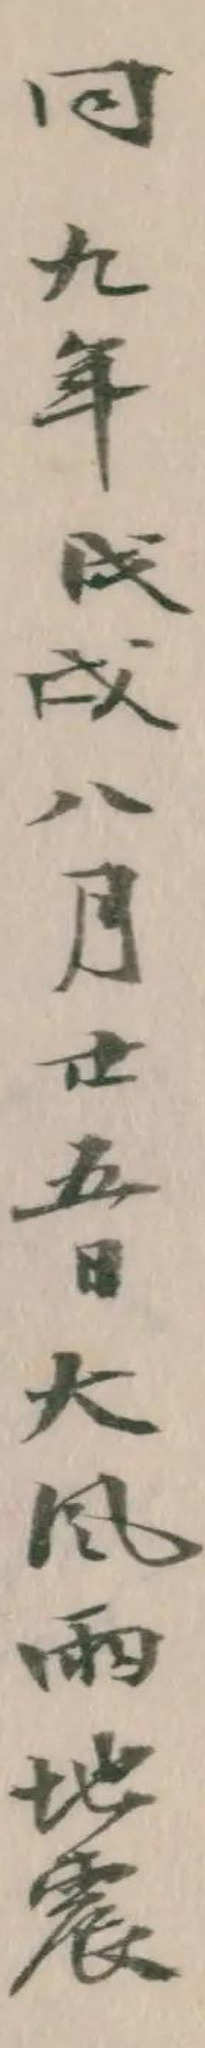同九年戊戌八月廿五日大風雨地震
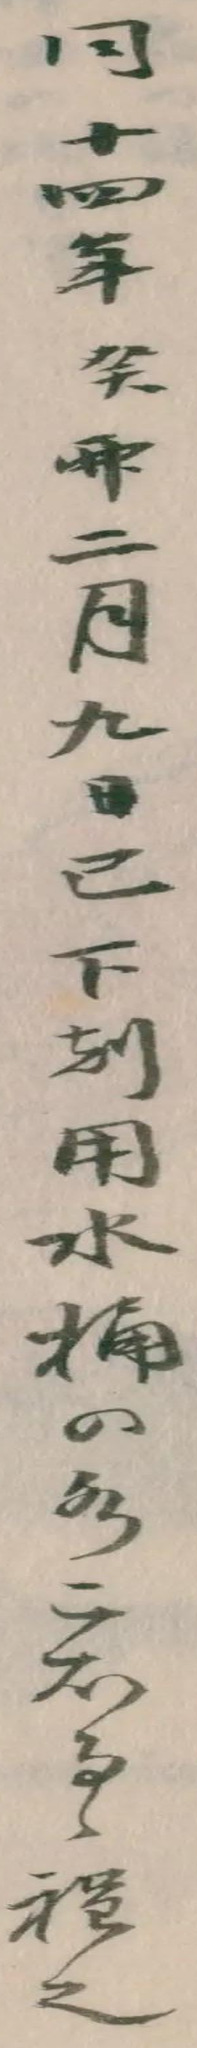同十四年癸卯二月九日巳下刻用水桶の水こほるゝ程也
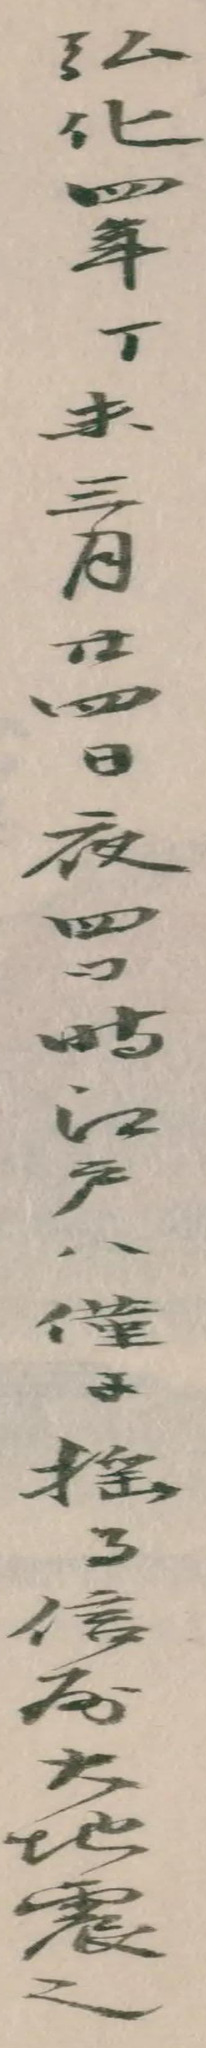弘化四年丁未三月廿四日夜四ツ時江戸は僅に揺る信州大地震也
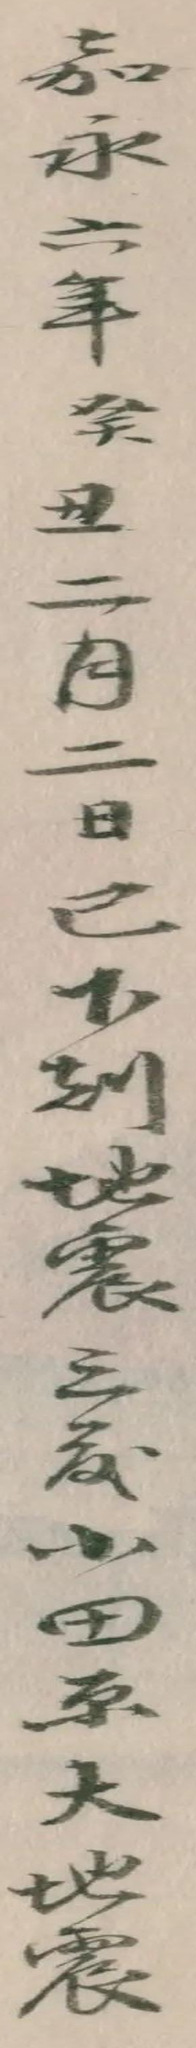嘉永六年癸丑二月二日巳下刻地震三度小田原大地震
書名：地災撮要. 巻10(地震之部) 上,下
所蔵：国立国会図書館 National Diet Library, JAPAN
